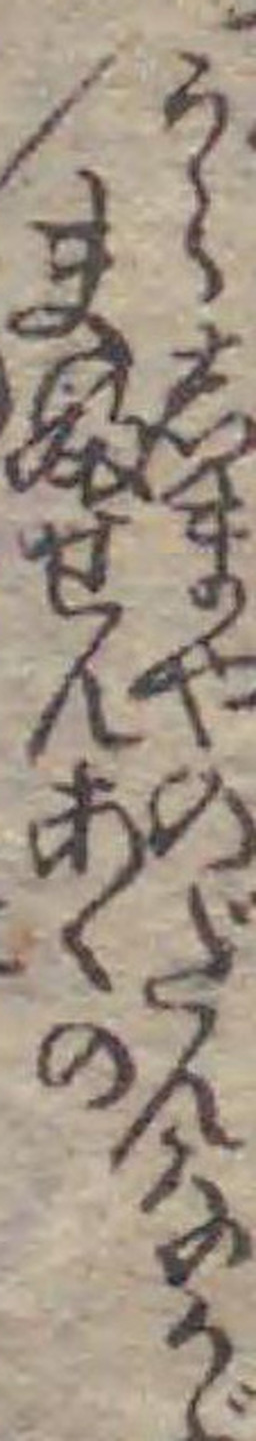夫婦せんあくの
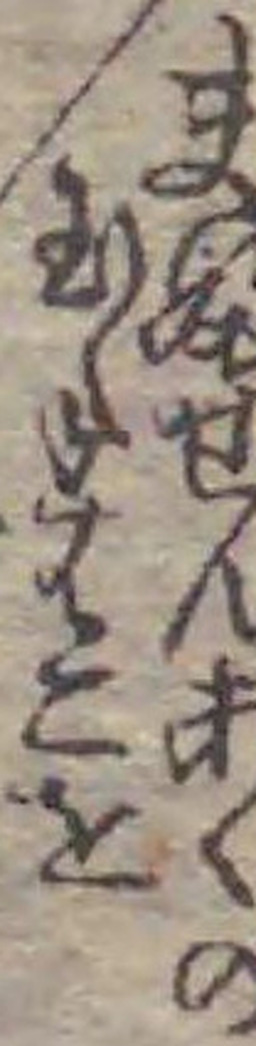玉手はこを
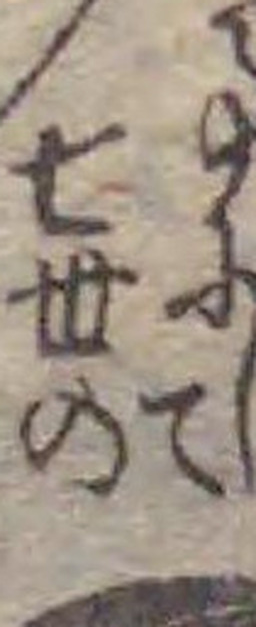七世の
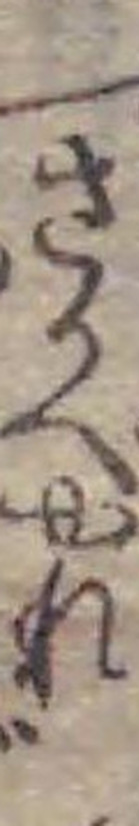さかへやれ
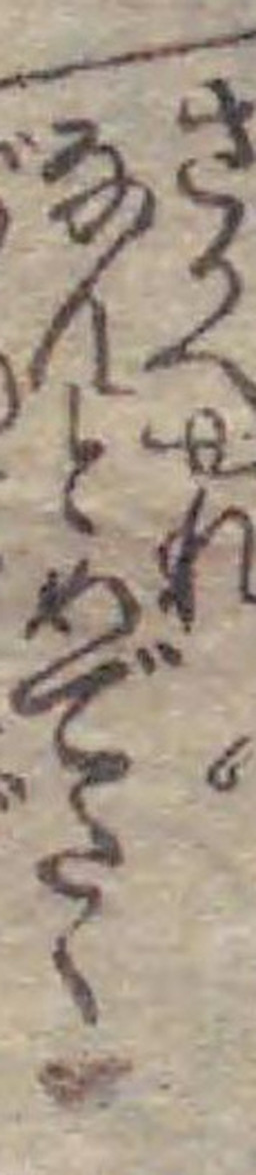なんとめでたく
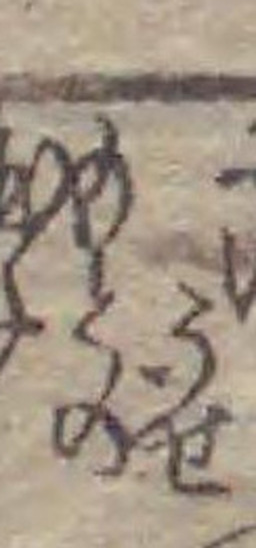もとの
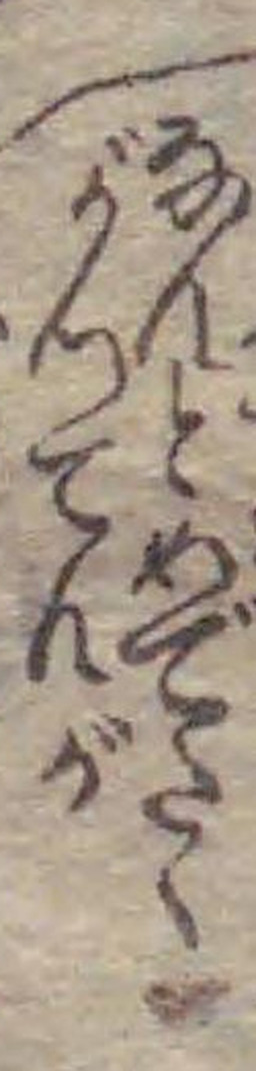がつてんが
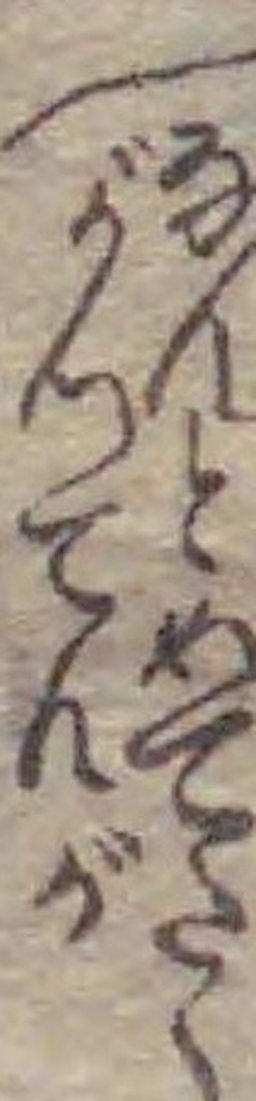がつてんが
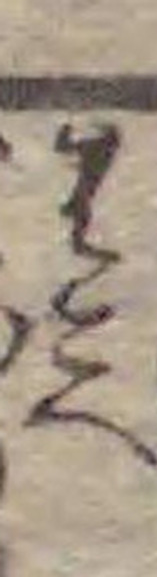はこへ
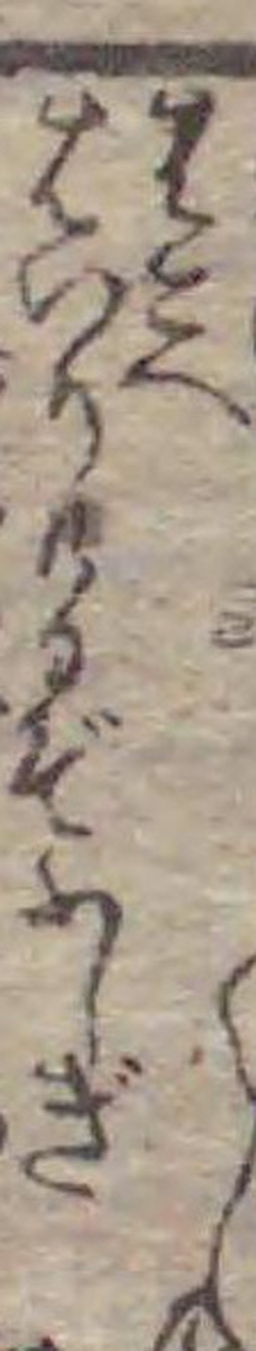はいりけるぞふしぎ
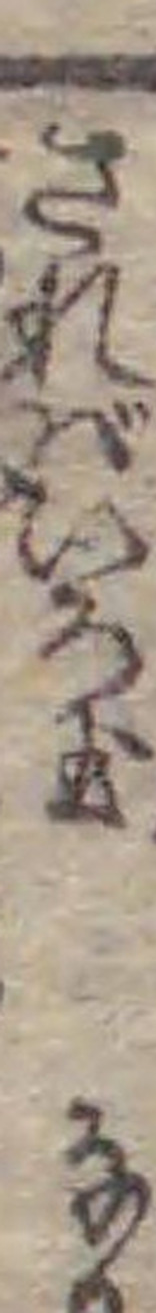さればいろ玉
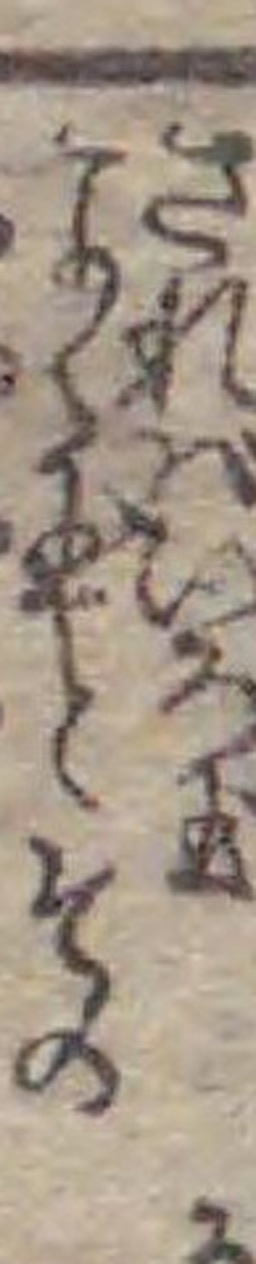よく玉とその
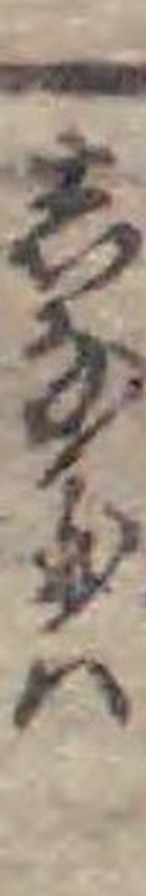しな玉は
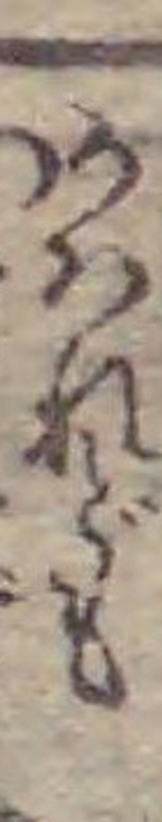かはれども
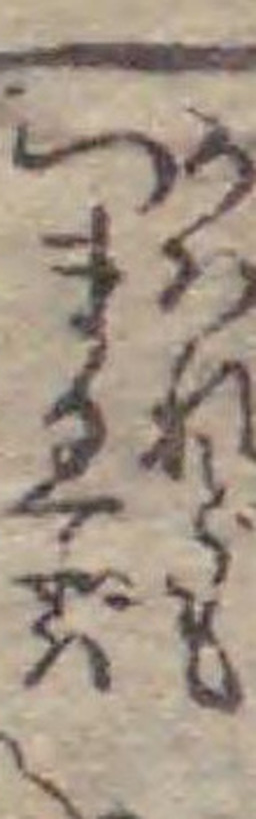つまる所は
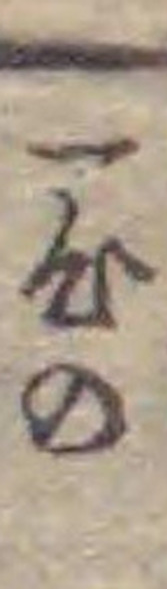一心の
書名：四遍搨心学草帋 : 3巻
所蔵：国立国会図書館 National Diet Library, JAPAN
